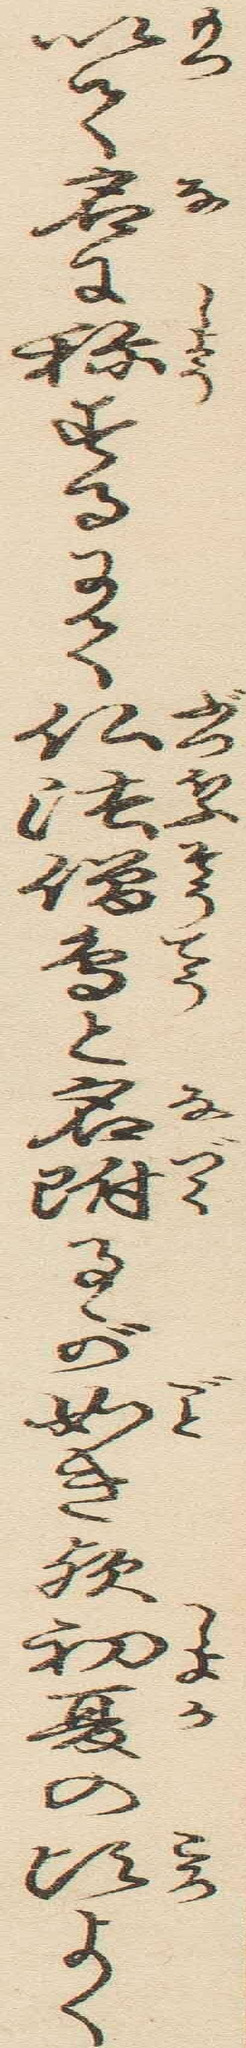以て名に称するにて仏法僧鳥と名附るが如き欤初夏の頃よく
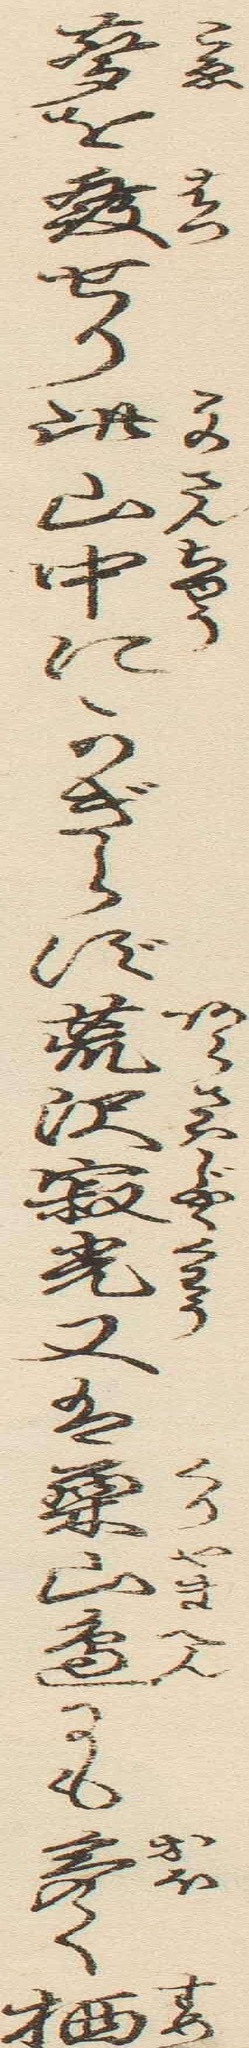聲を發せり此山中にかぎらず荒沢寂光又は栗山邊にも多く栖
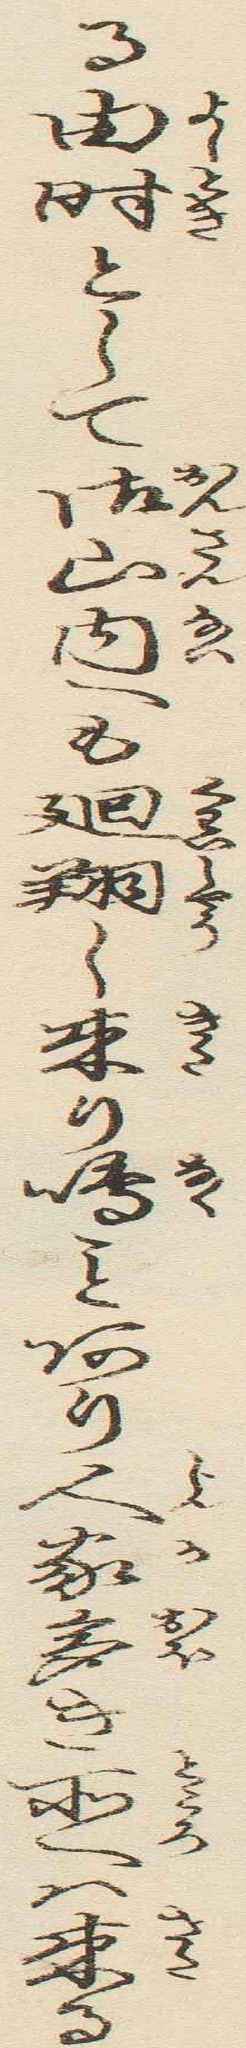る由时として御山内へも𢌞翔し來り鳴ことあり人家多き所へは來る
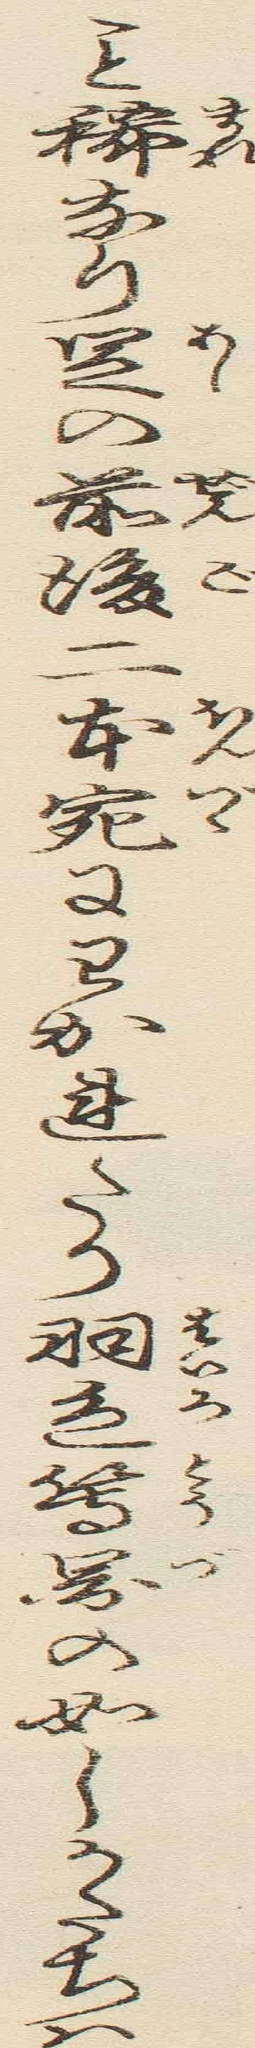こと稀なり足の前後二本宛にわかれたり羽色等圖の如しかたちは
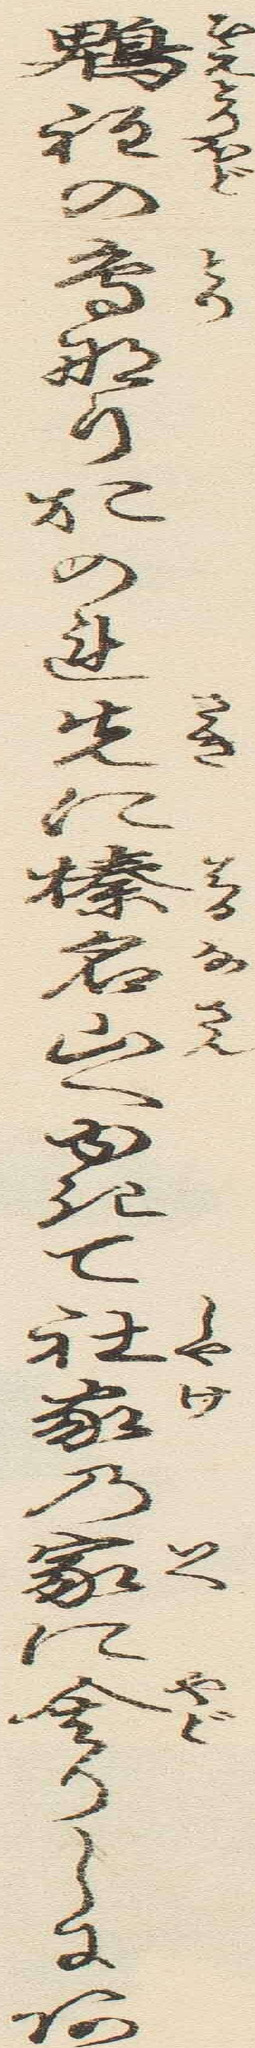鵯程の鳥なりおのれ先に榛名山へゆきて社家の家に舎りしにあ
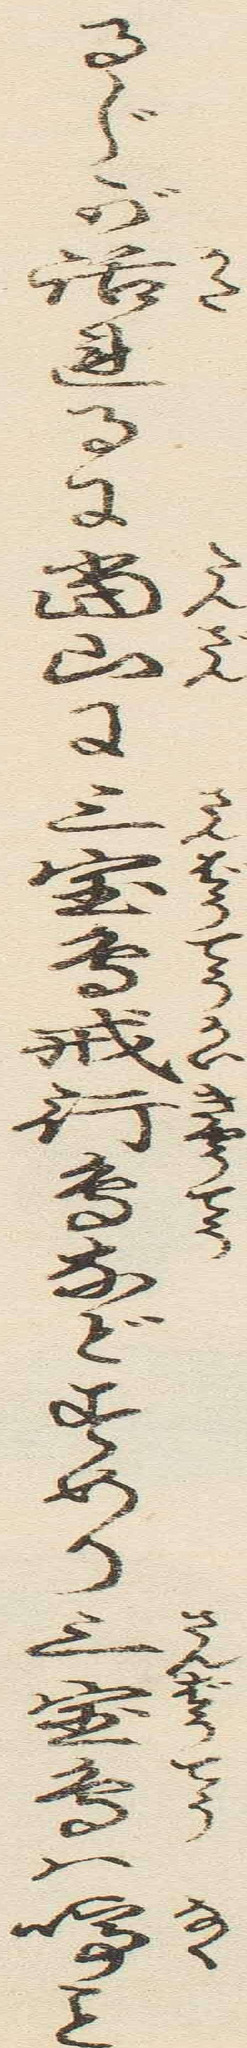るじが話れるに當山に三宝鳥戒行鳥などすめり三宝鳥は鳴こと
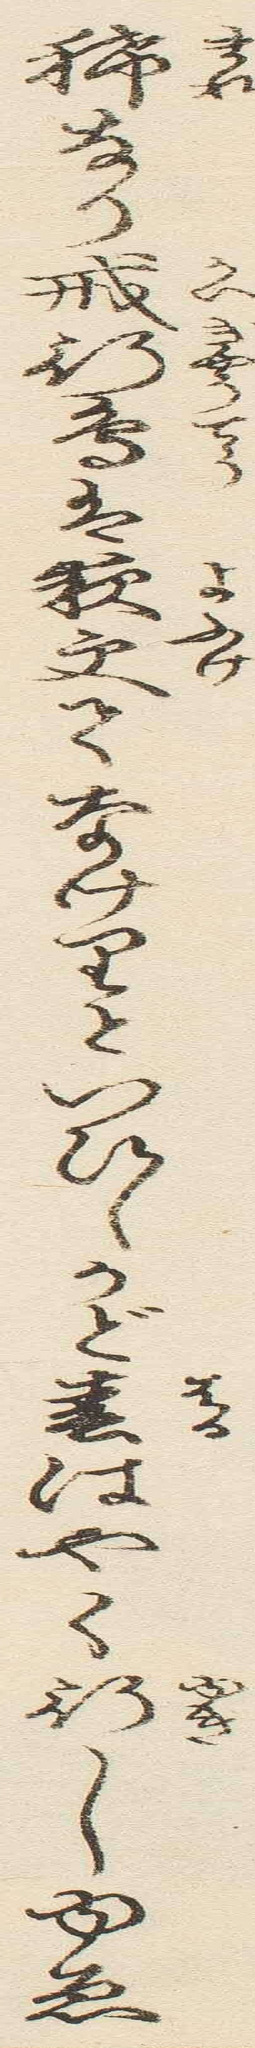稀なり戒行鳥は夜更てなけりといひしかど春はやく行しゆゑ
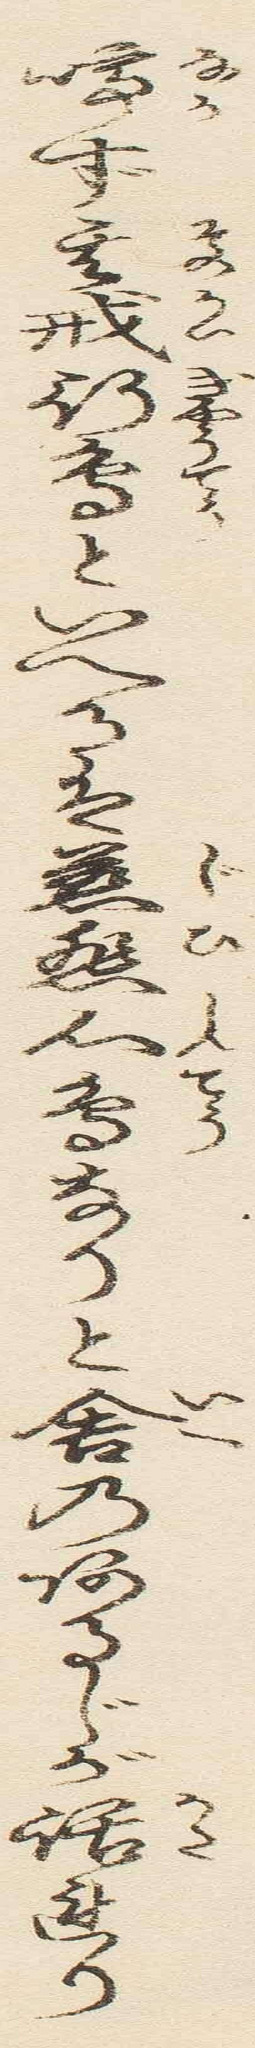鳴ず其戒行鳥といへるは慈悲心鳥なりと舎のあるじが話れり
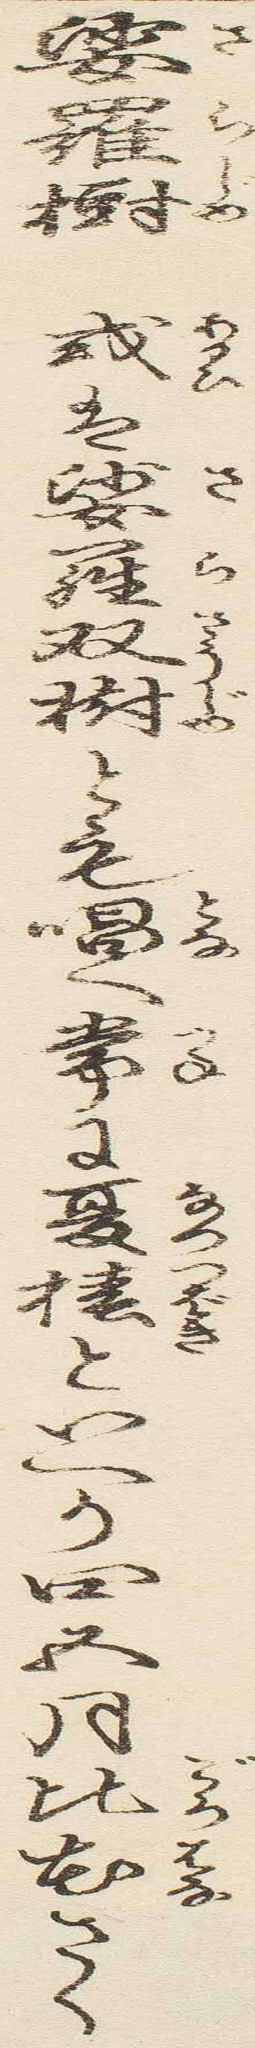娑羅樹或は娑羅双樹とも唱へ常に夏椿といへり四五月比花さく
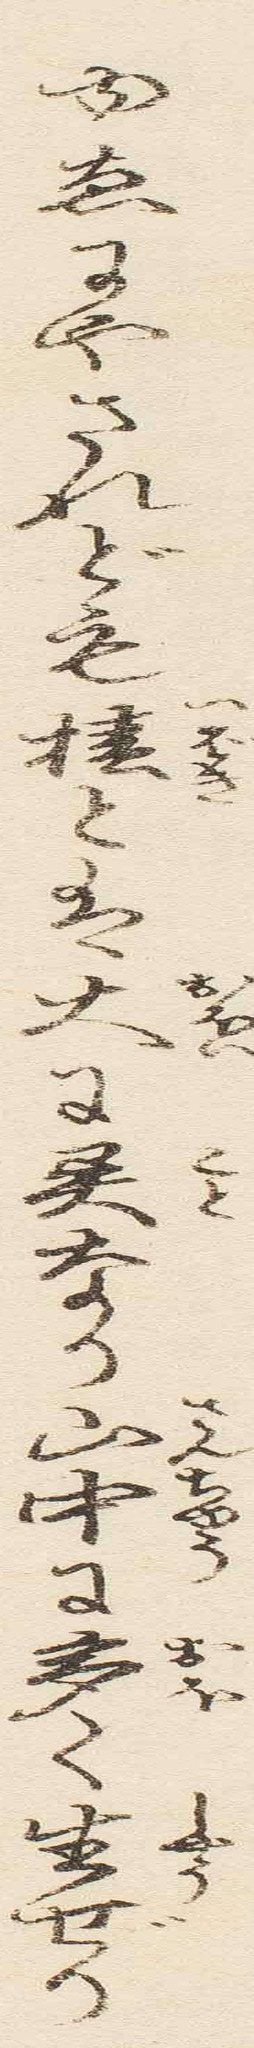ゆゑにやされども椿とは大に異なり山中に多く生ぜり
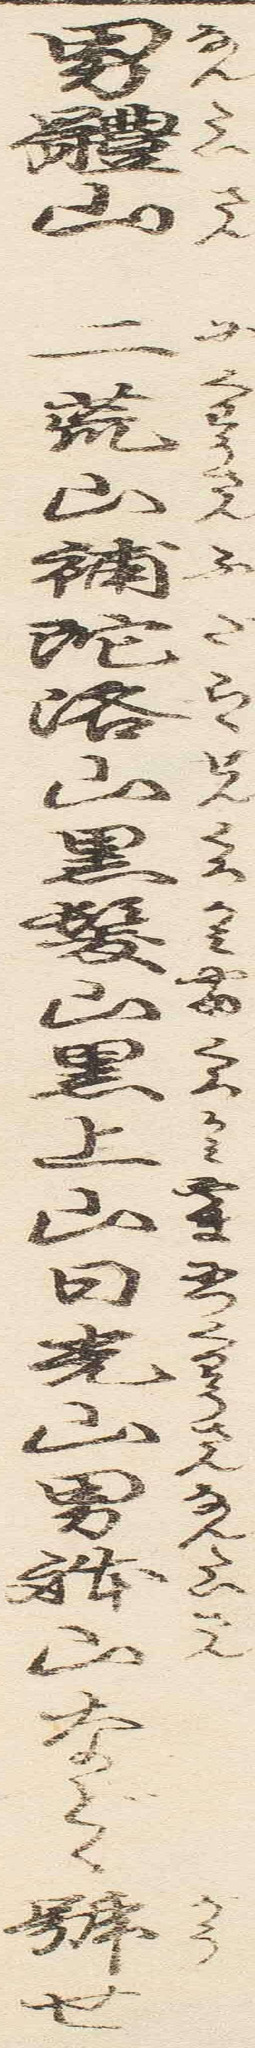男體山二荒山補陀洛山黒髪山黒上山日光山男躰山などゝ號せ
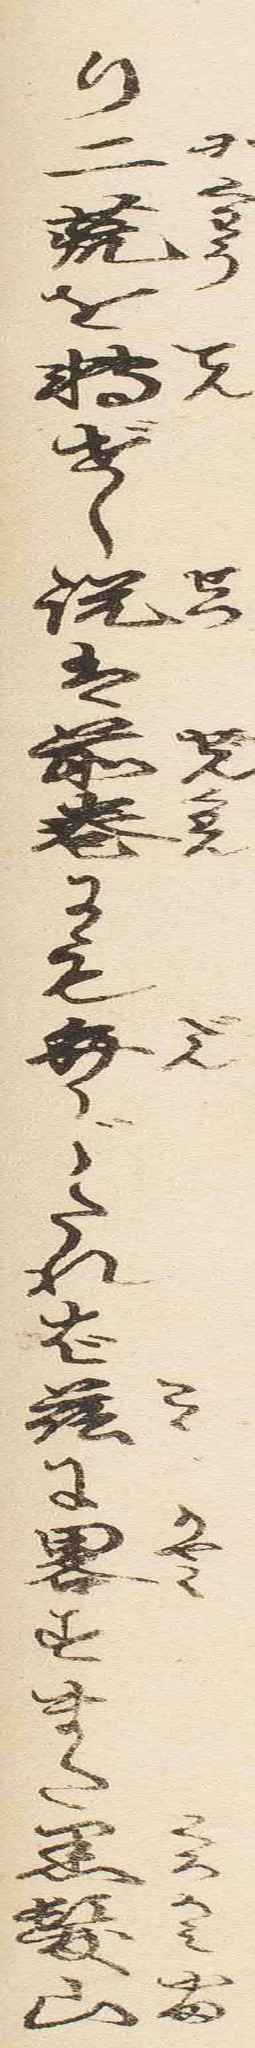り二荒を轉ぜし説は前巻にも弁じたれば兹に畧すまた黒髪山
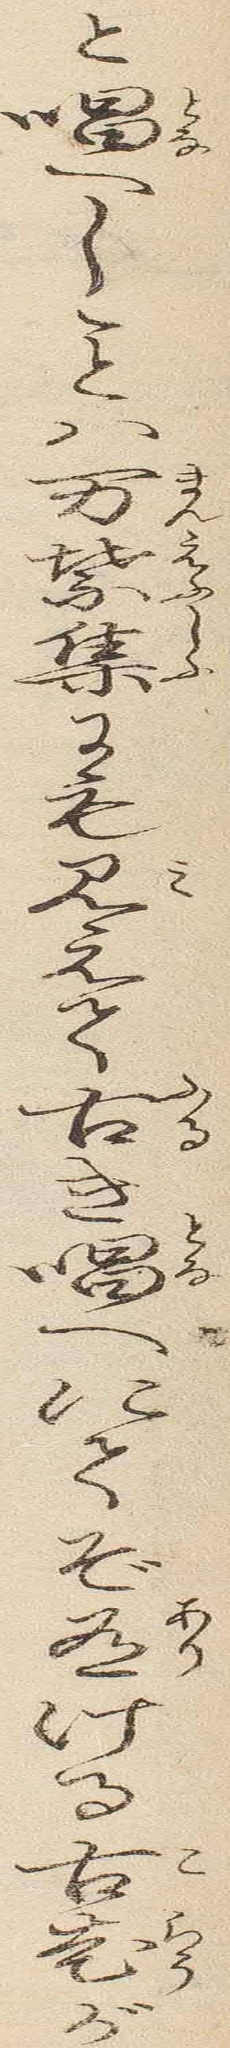と唱へしことは万葉集にも見えて古き唱へにてぞ有ける古老が
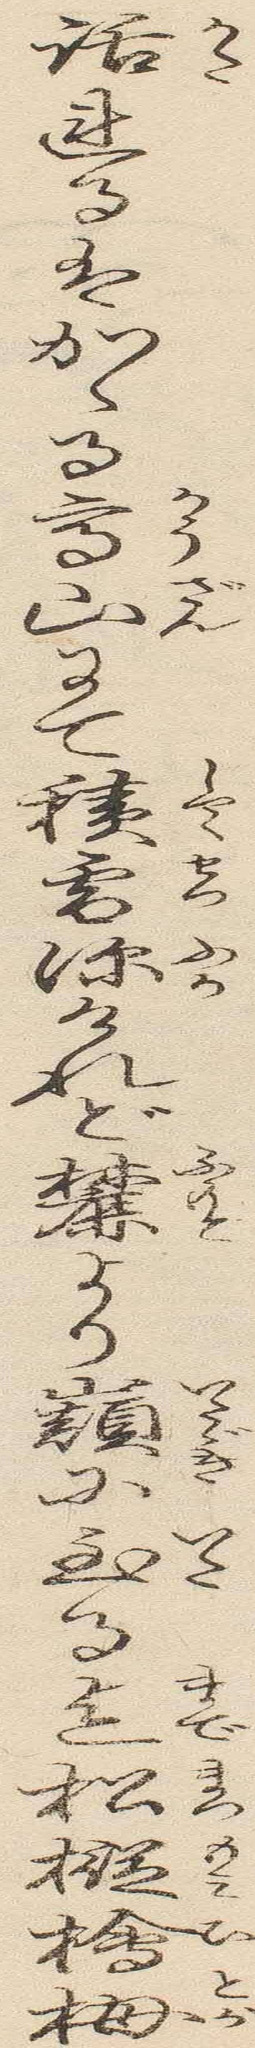話れるはかゝる高山にて積雪深けれど麓より巔に至る迄松樅檜栂
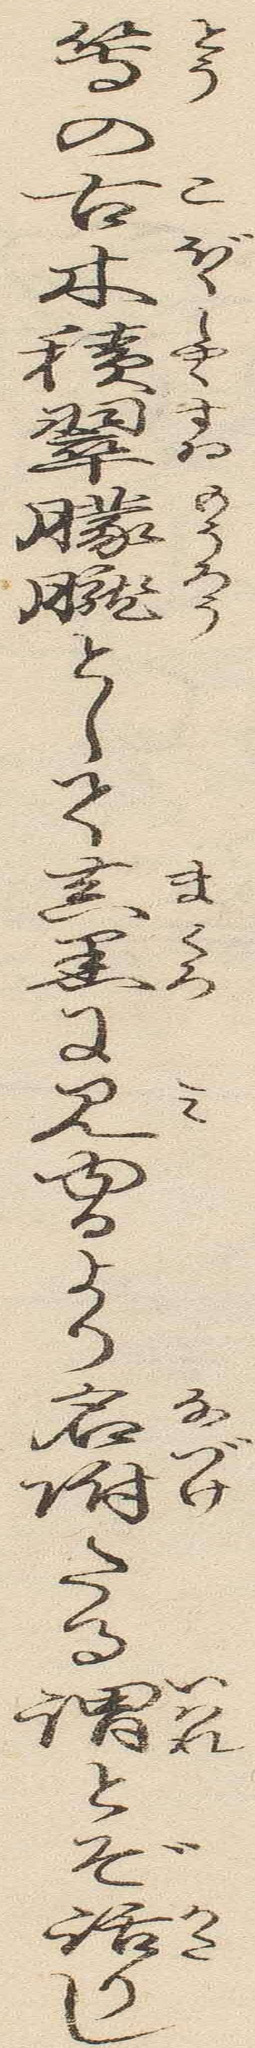等の古木積翠朦朧として真黒に見ゆるより名附たる謂とぞ話りし
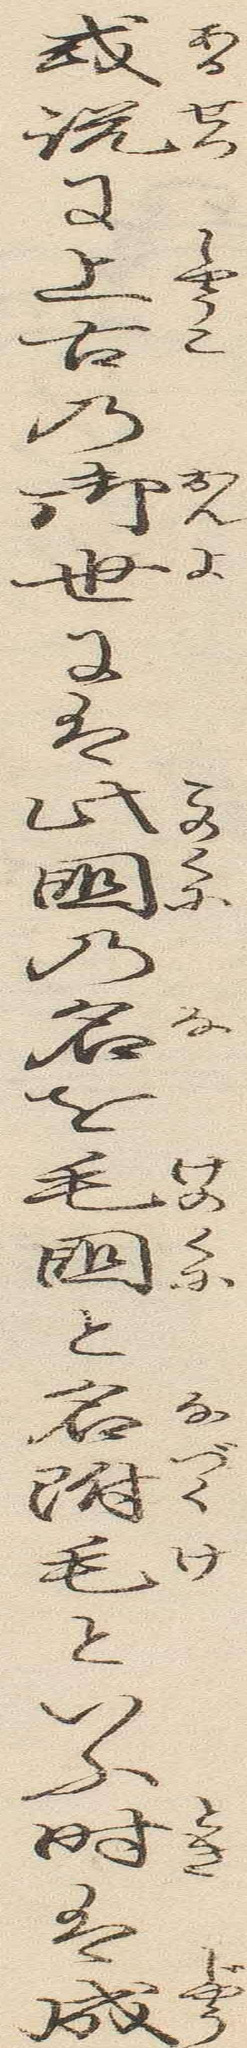或説に上古の御世には此國の名を毛國と名附毛といふ时は成
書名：日光山志
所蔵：東京学芸大学附属図書館 国文学研究資料館
